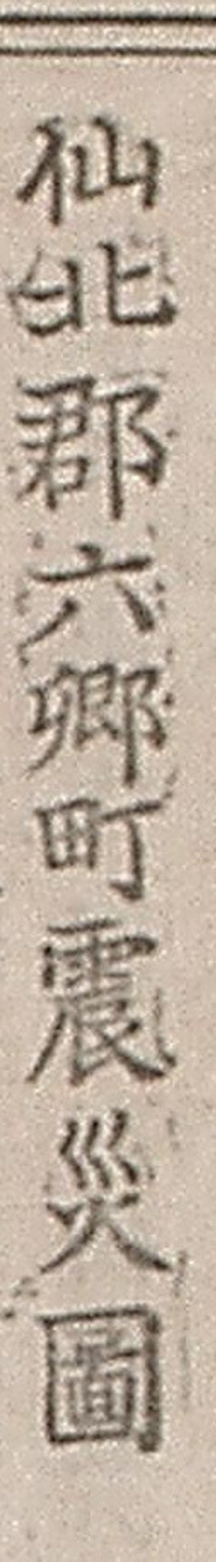仙北郡六郷町震災図
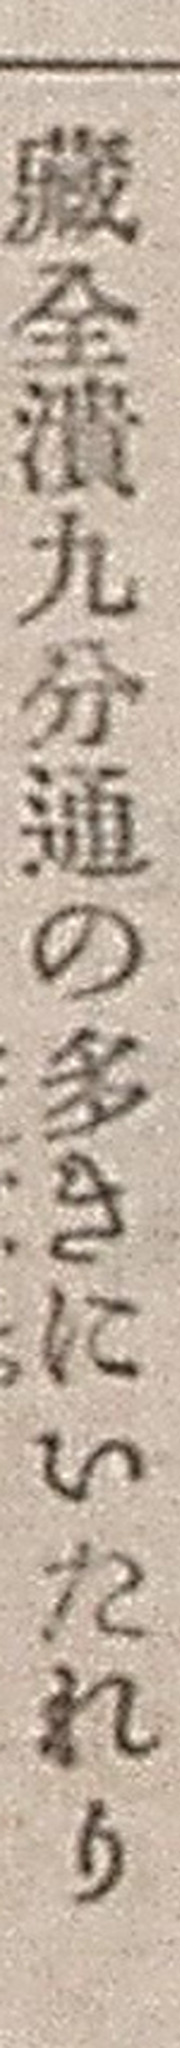藏全潰九分通の多きにいたれり
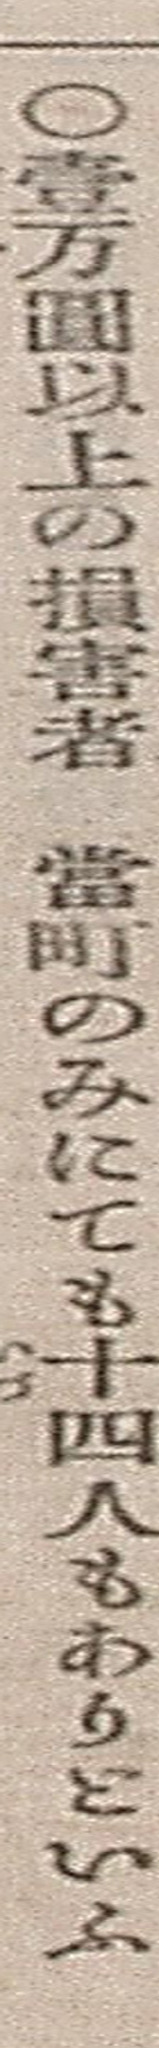〇壱万円以上の損害者当町のみにても十四人もありといふ
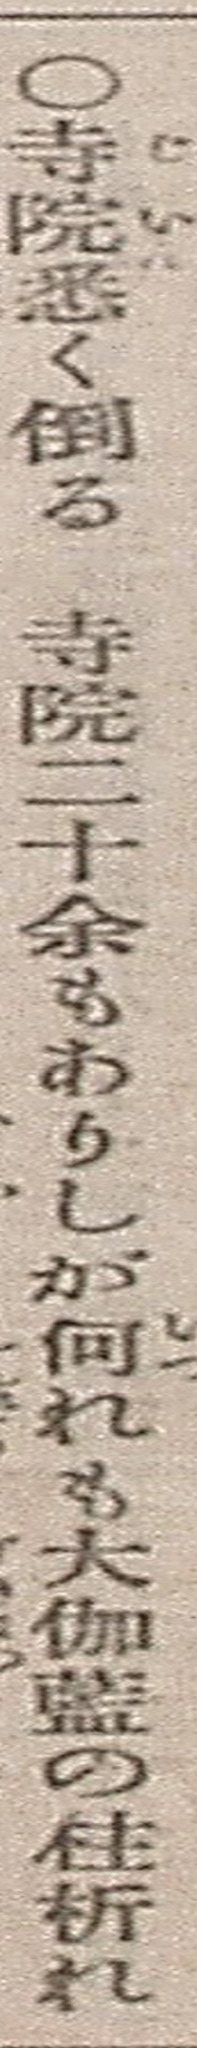〇寺院悉く倒る寺院二十余もありしが何れも大伽藍の柱析れ
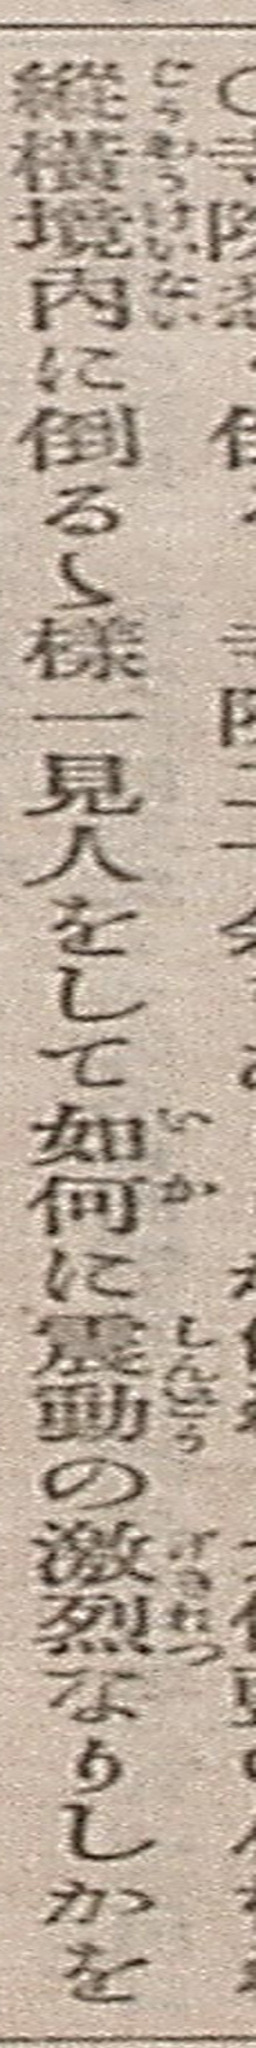縦横境内に倒るゝ様一見人をして如何に震動の激烈なりしかを
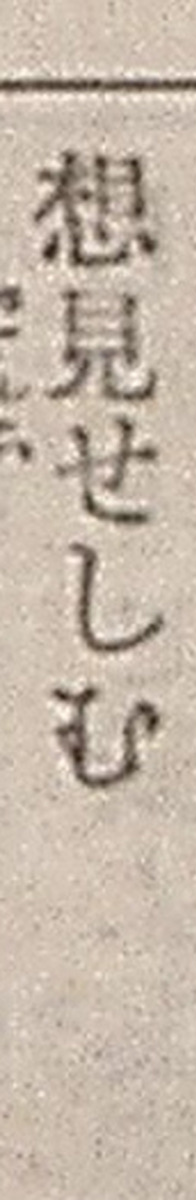想見せしむ
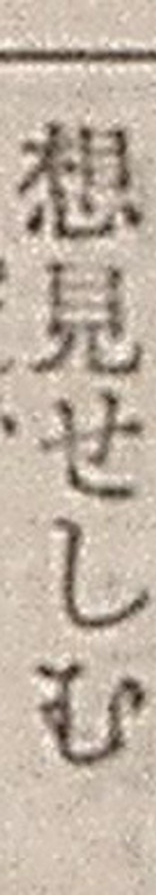想見せしむ
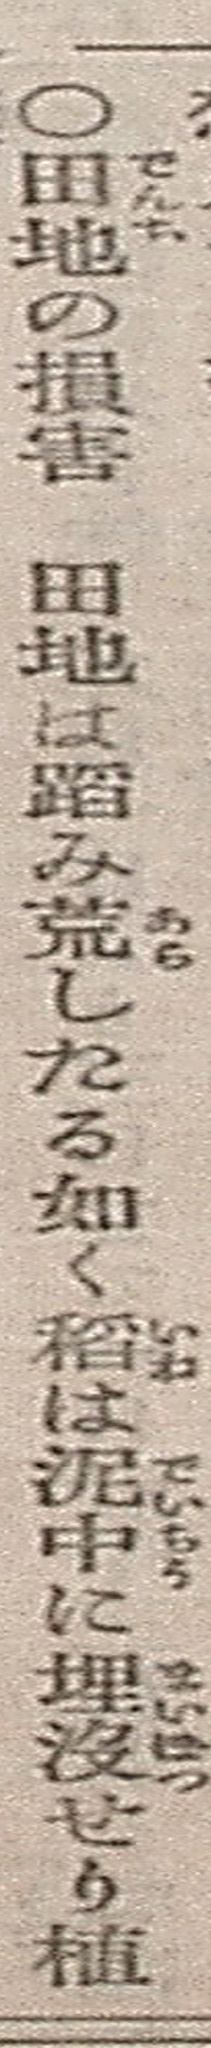〇田地の損害田地は踏み荒したる如く稲は泥中に埋没せり植
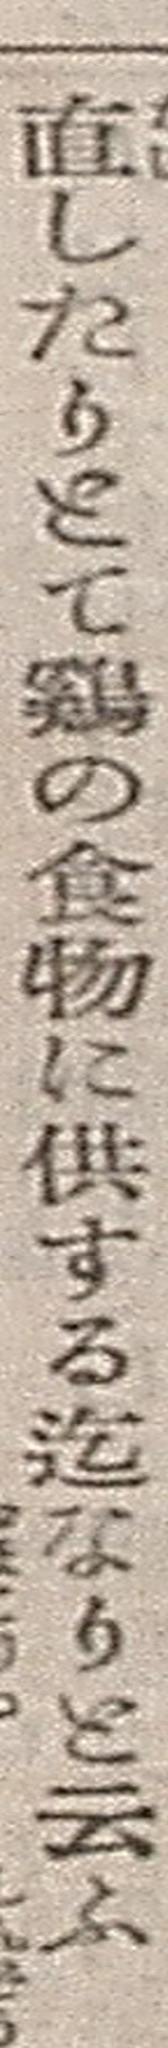直したりとて鶏の食物に供する迄なりと云ふ
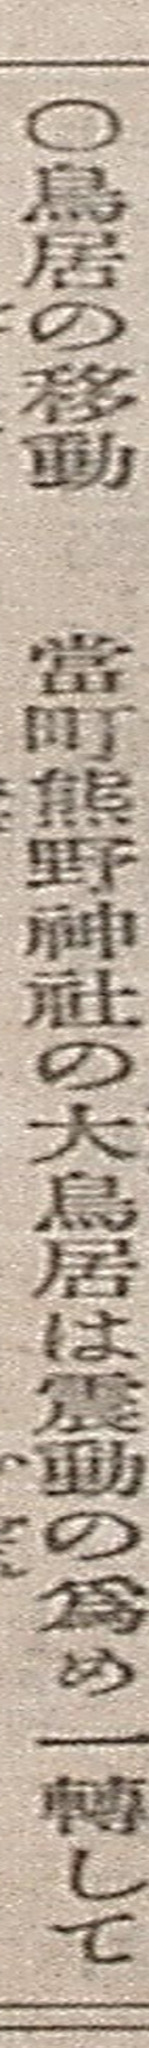〇鳥居の移動当町熊野神社の大鳥居は震動の為め一転して
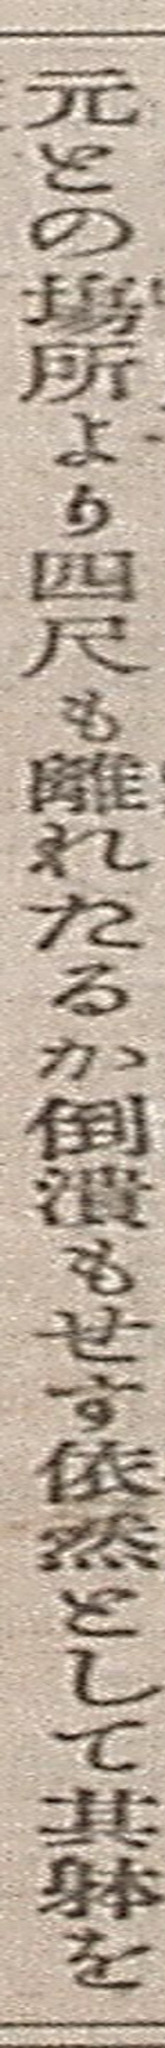元との場所より四尺も離れたるか倒潰もせず依然として其体を
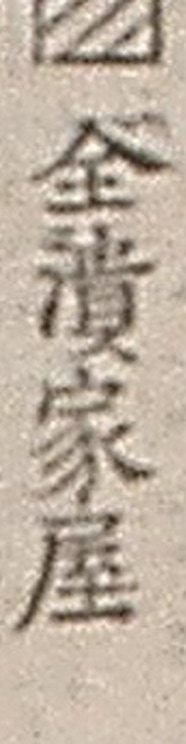全潰家屋
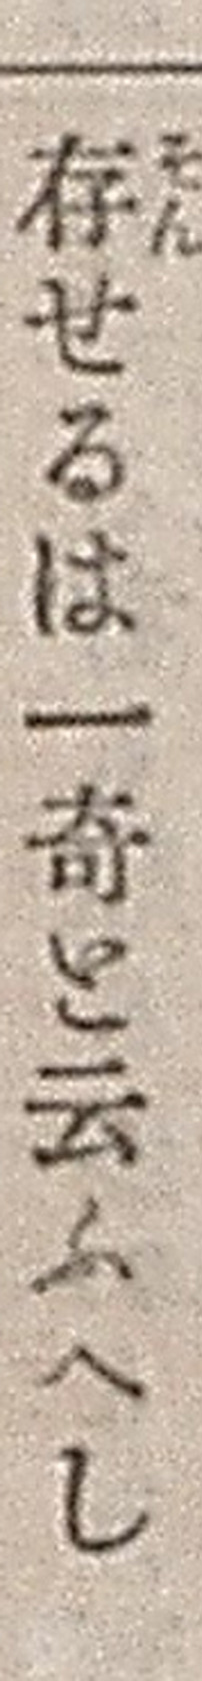存せるは一奇と云ふへし
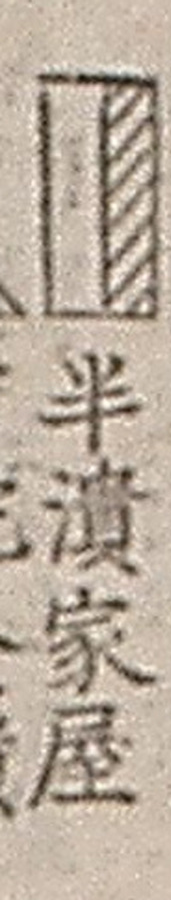半潰家屋
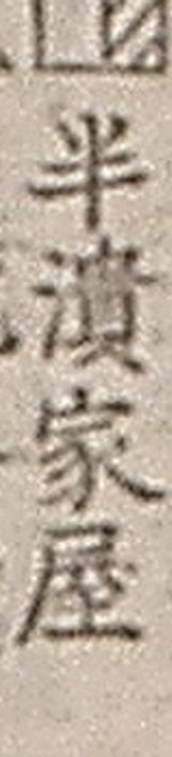半潰家屋
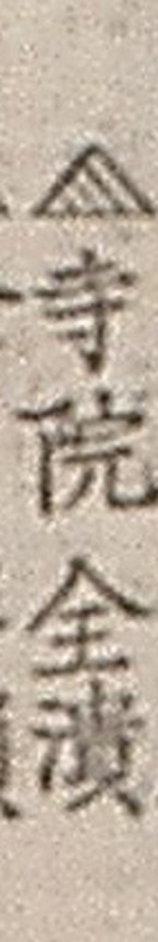寺院全潰
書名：風俗畫報臨時増刊第百二十四號　洪水地震被害録（上）
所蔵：東京大学地震研究所図書室 Earthquake Research Institute Library, The University of Tokyo, JAPAN
